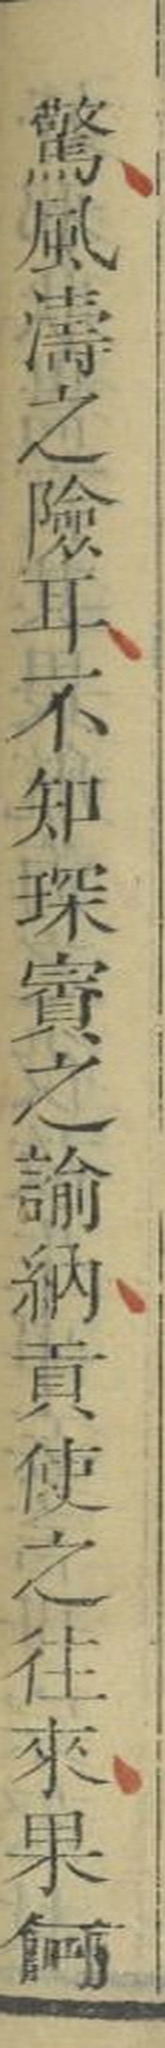驚風濤之険耳不知琛賨之諭納貢使之往来果何
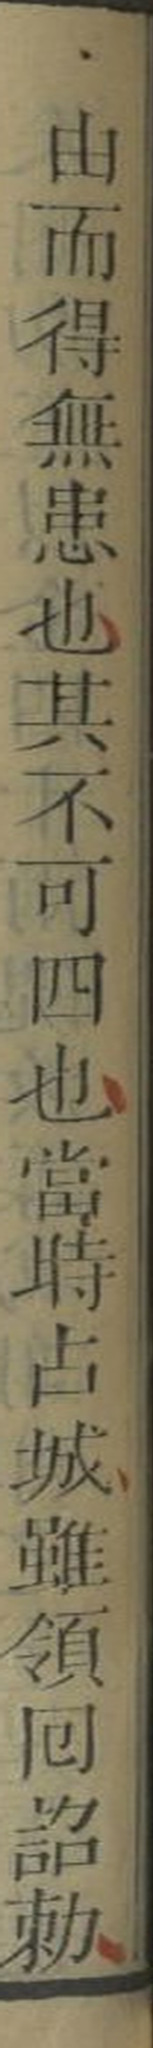由而得無患也其不可四也当時占城雖領回詔勅
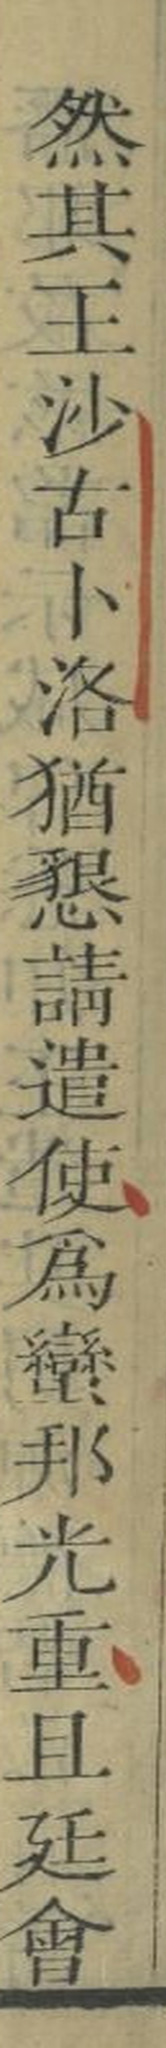然其王沙古卜洛猶懇請遣使為蛮邦光重且廷会
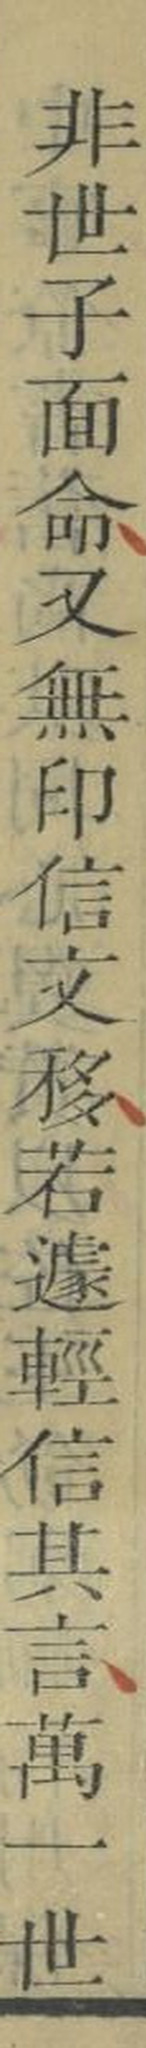非世子面命又無印信文移若遽軽信其言万一世
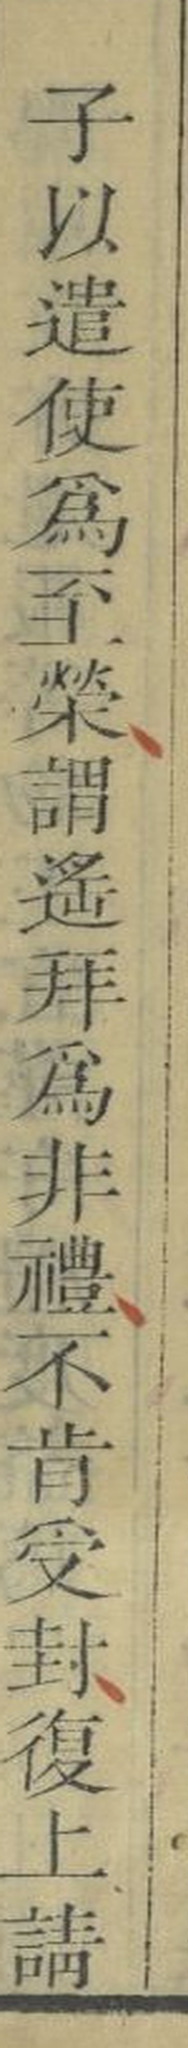子以遣使為至栄謂遥拝為非礼不肯受封復上請
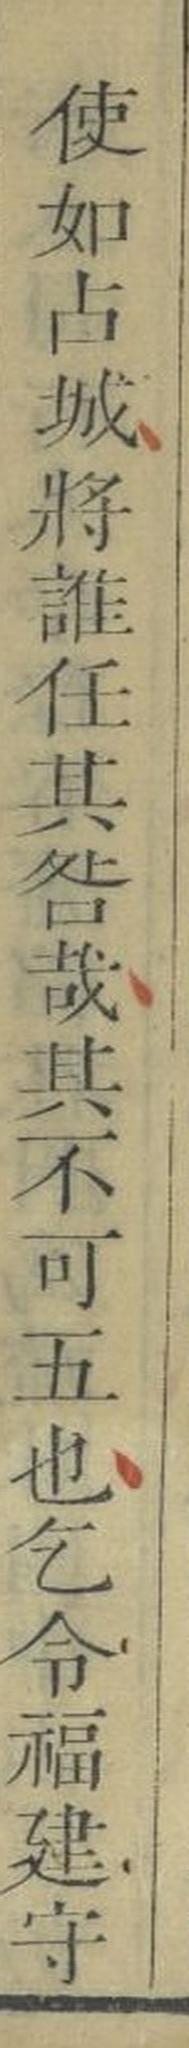使如占城将誰任其咎哉其不可五也乞令福建守
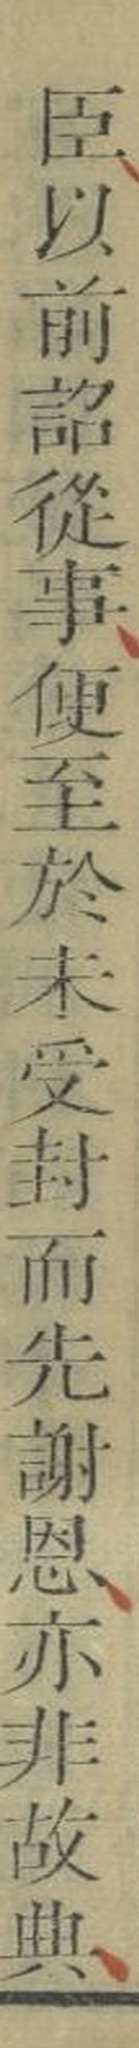臣以前詔従事便至於未受封而先謝恩亦非故典
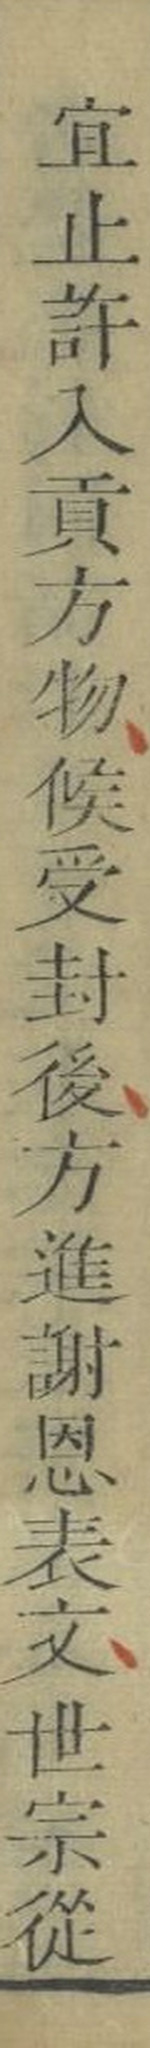宜止許入貢方物候受封後方進謝恩表文世宗従
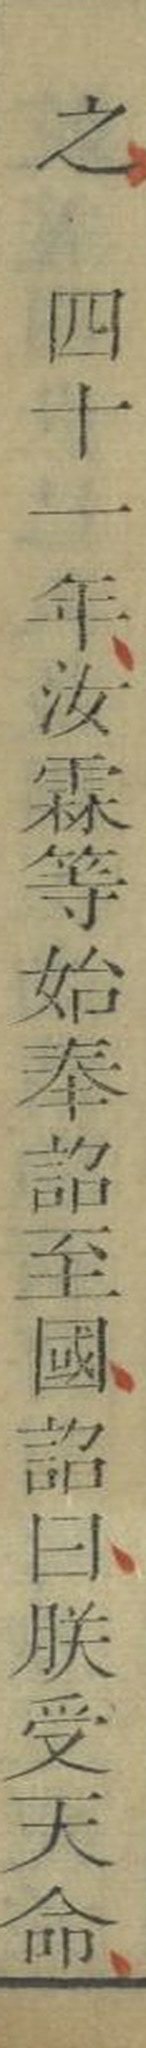之四十一年汝霖等始奉詔至国詔曰朕受天命
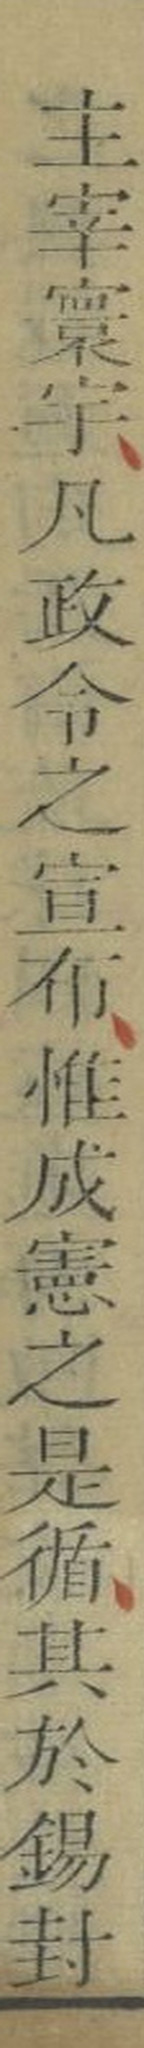主宰寰宇凡政令之宣布惟成憲之是循其於錫封

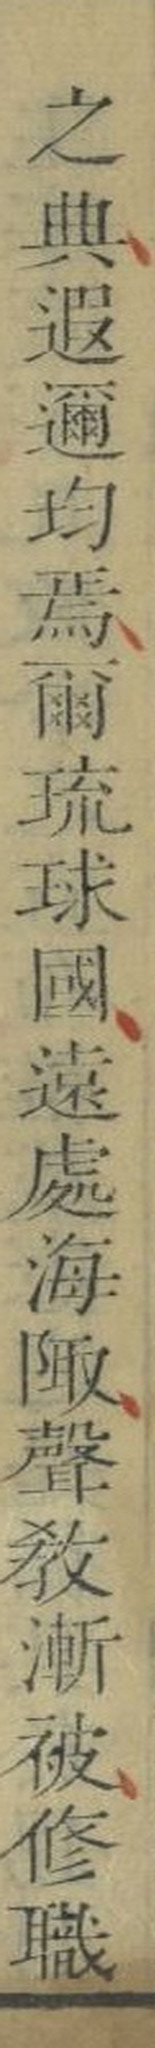之典遐邇均焉爾琉球国遠処海陬声教漸被修職
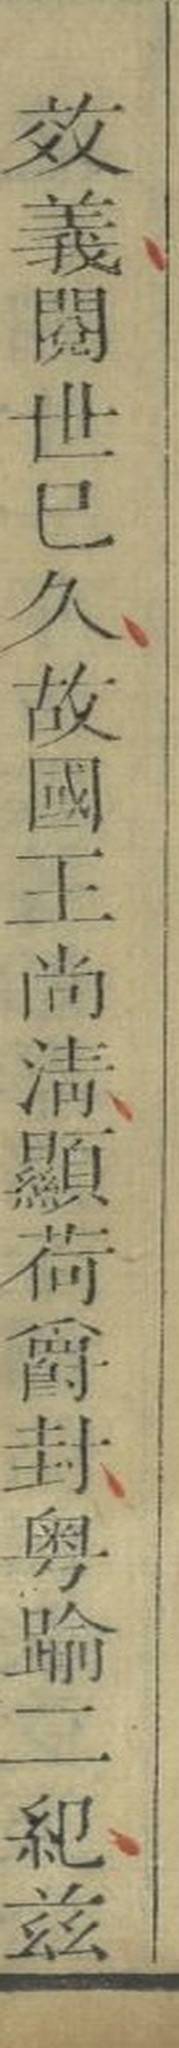效義閲世巳久故国王尚清顕荷爵封粤踰二紀茲
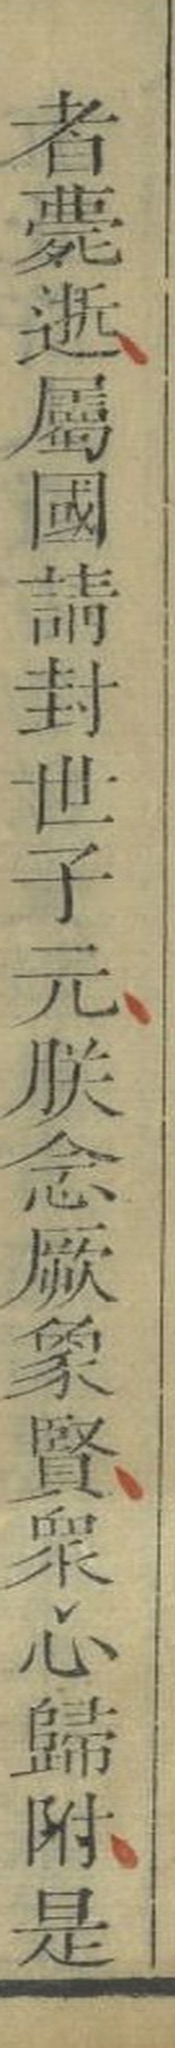者薨逝属国請封世子元朕念厥象賢衆心帰附是
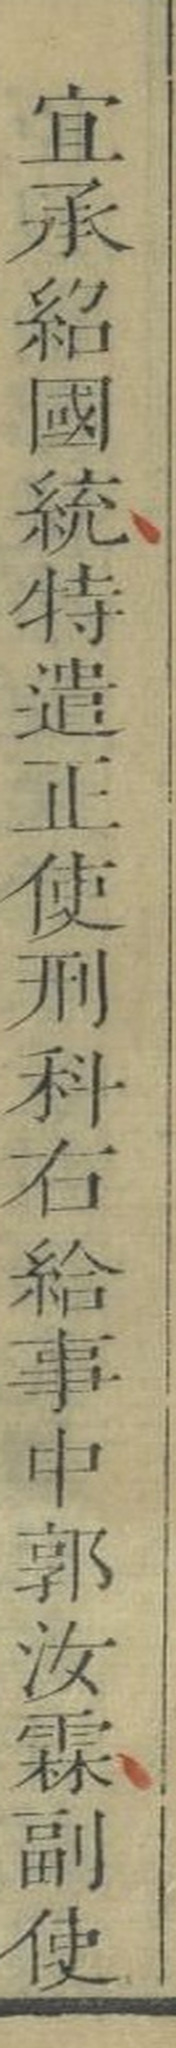宜承紹国統特遣正使刑科右給事中郭汝霖副使
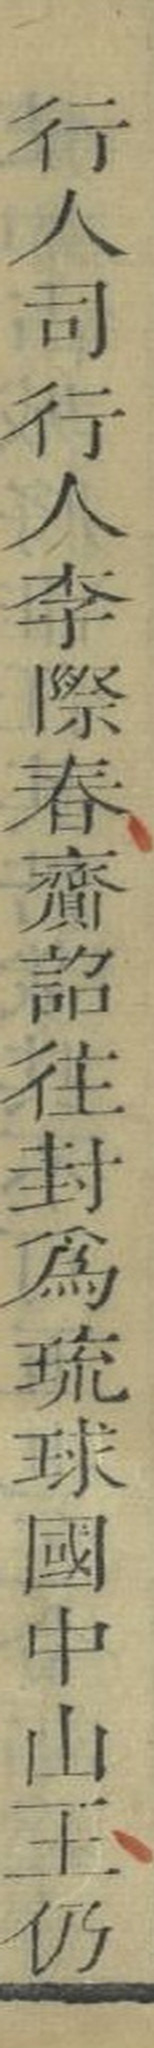行人司行人李際春齎詔往封為琉球国中山王仍
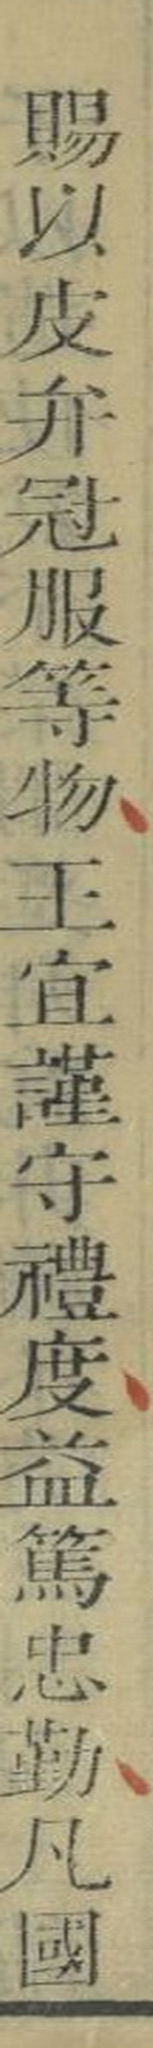賜以皮弁冠服等物王宜謹守礼度益篤忠勤凡国
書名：中山伝信録 巻三
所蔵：University of the Ryukyus Library
